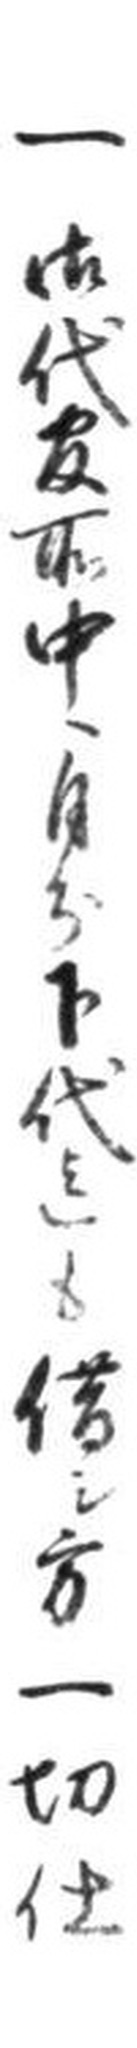一御代官所中へ自分下代迄も借シ方一切仕
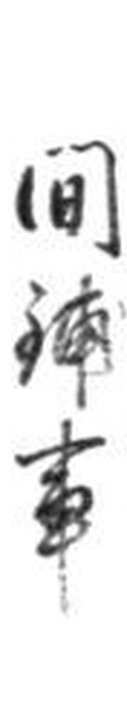間鋪事
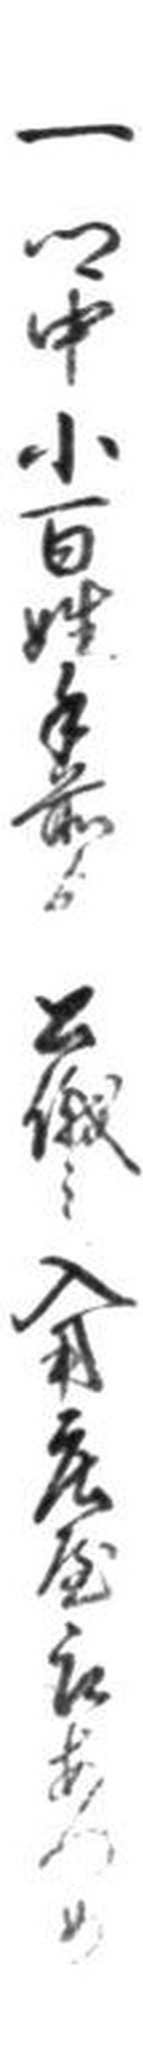一郷中小百姓手前ゟ公儀之入用庄屋取あつめ
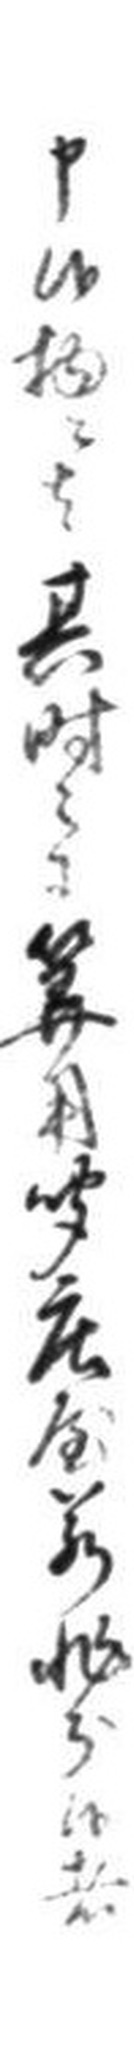申候物ニは其時々に算用聞庄屋若非分候者
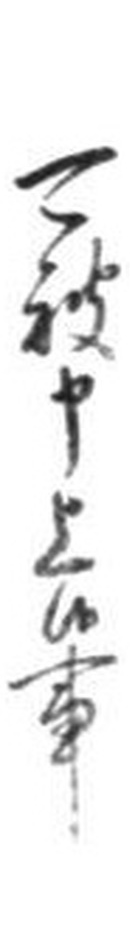可被申上候事
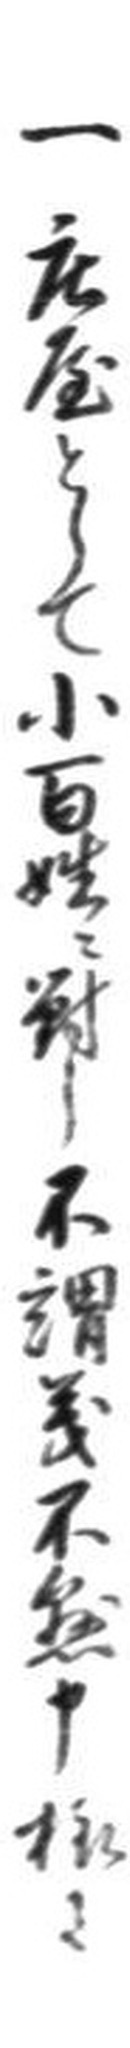一庄屋として小百姓ニ対し不謂義不懸申様に
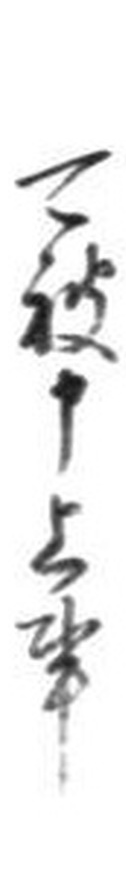可被申上事
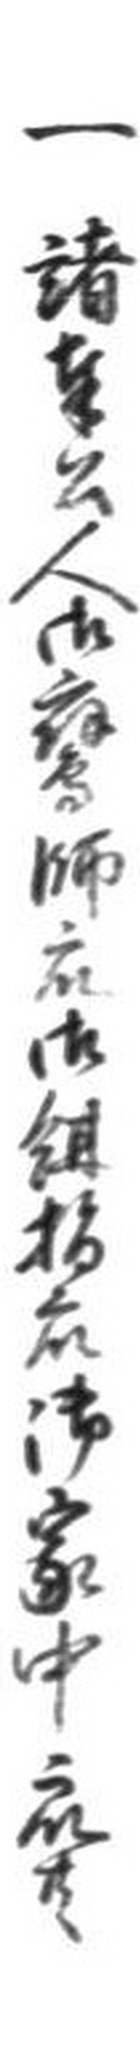一諸奉公人御鷹師衆御餌指衆御家中衆共
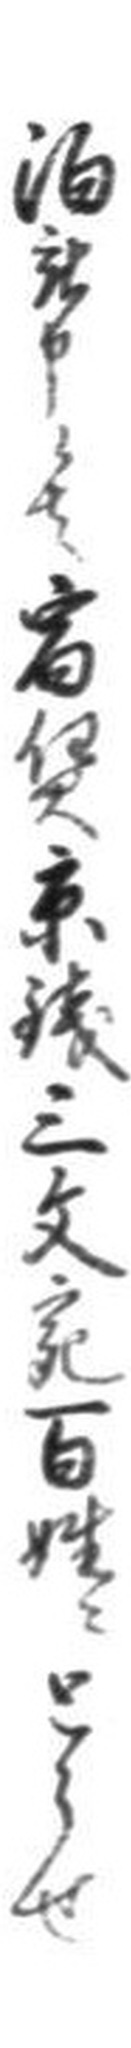泊被申候は宿賃京銭三文宛百姓ニとらせ
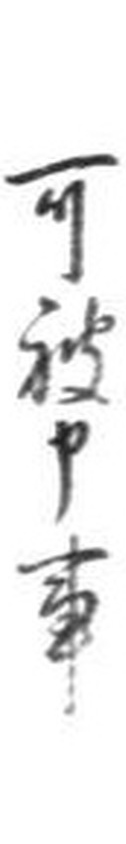可被申事

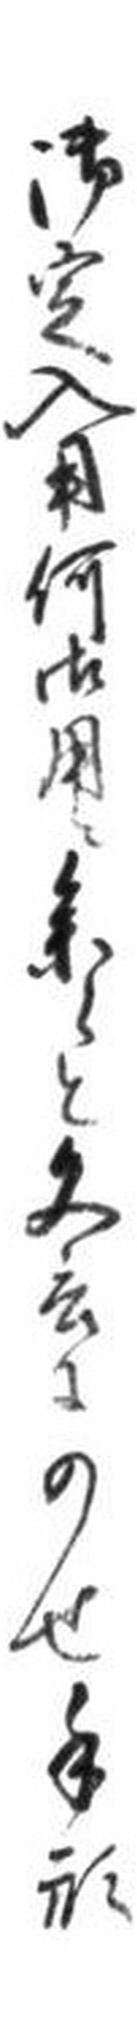御定入用何御用ニ参候と文言にのせ手形
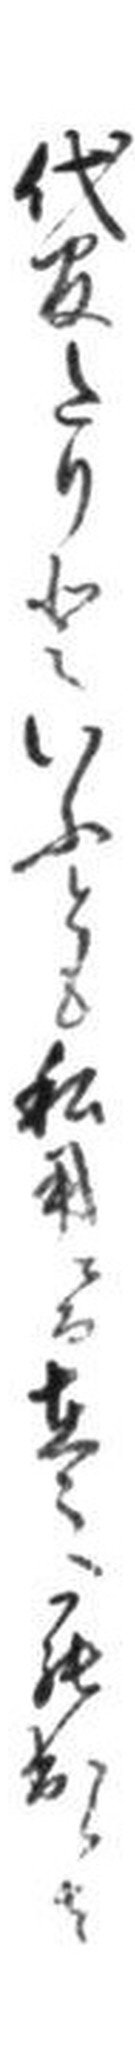代官たりといふとも私用ニ而在々へ罷出候は
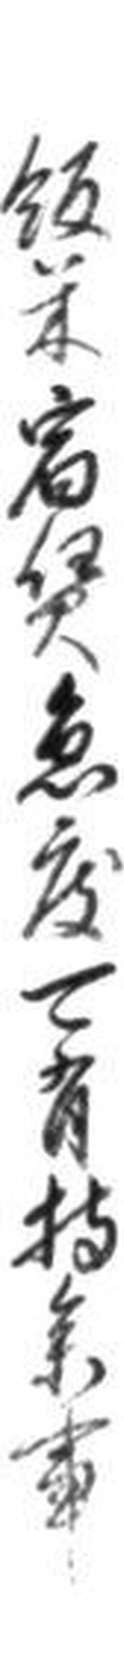飯米宿賃急度可有持参事
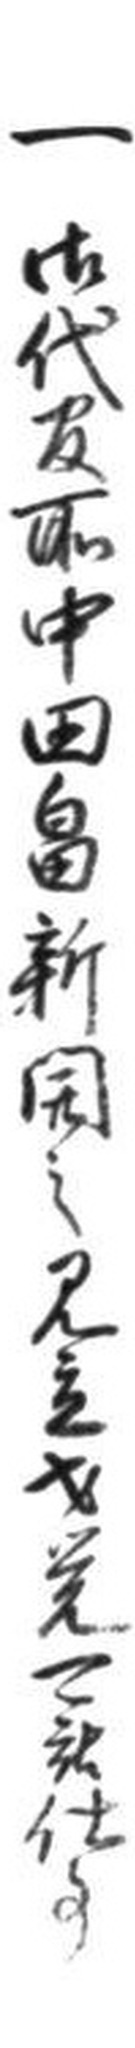一御代官所中田畠新開之見立才覚可被仕事
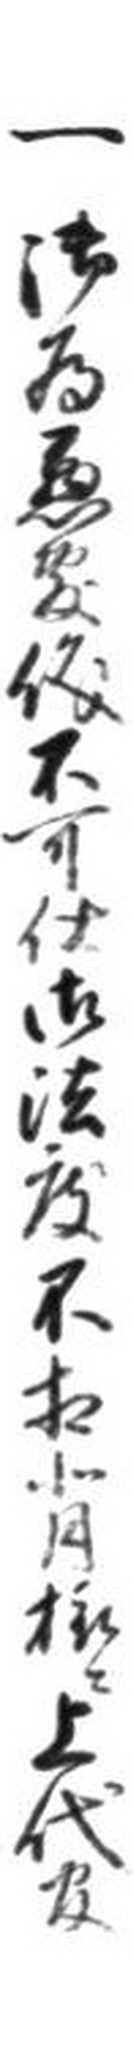一御為悪敷儀不可仕御法度不相背様ニ上代官
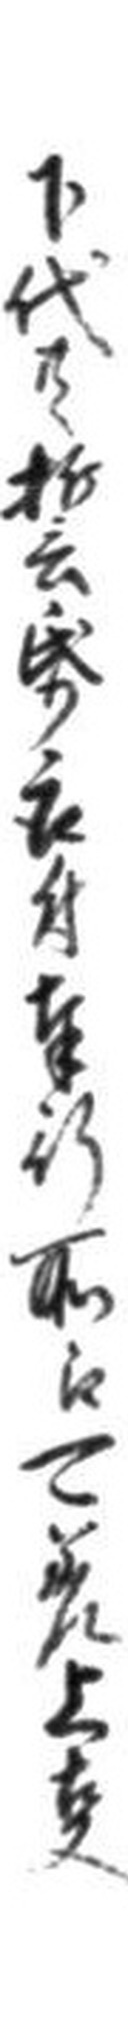下代共誓紙取付奉行所江可差上事
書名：家譜 三 忠昌公 従慶長八年到寛永六年
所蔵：福井県文書館 Fukui Prefectural Archives
